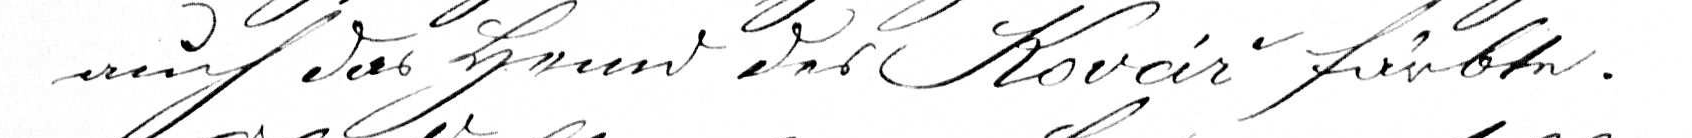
auch das Hemd des Kovár färbte.
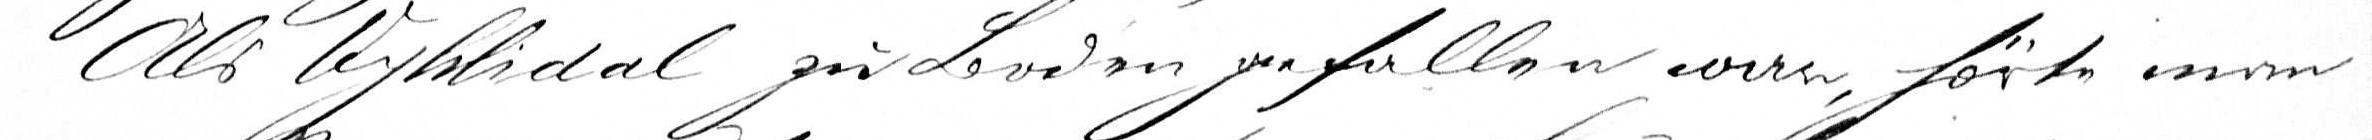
Als Vyhlidal zu Boden gefallen war, hörte man
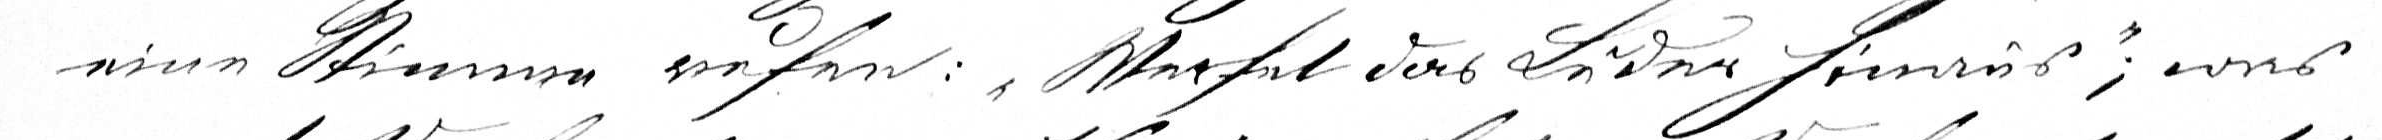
eine Stimme rufen: „Werfel das Luder hiraus“; was
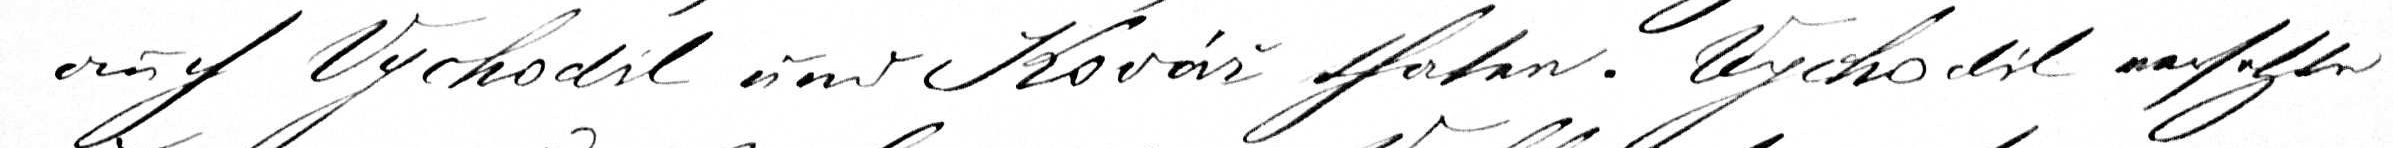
auch Vychodil und Kovár thaten. Vychodil versetzte
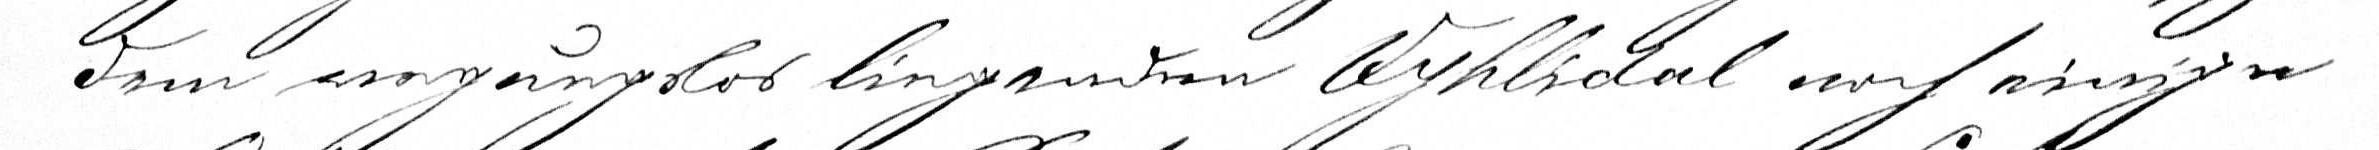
dem wogungslos liegenden Vyhlidal noch einige
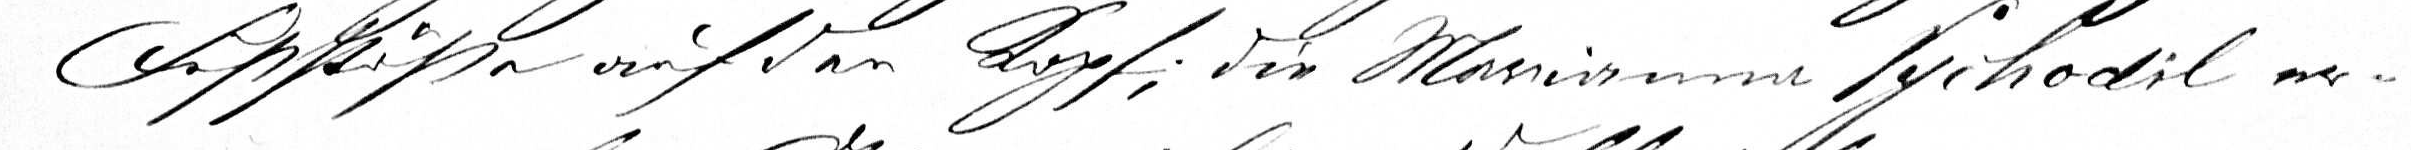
xx auf den Kopf; die Marianna Vychodil er¬
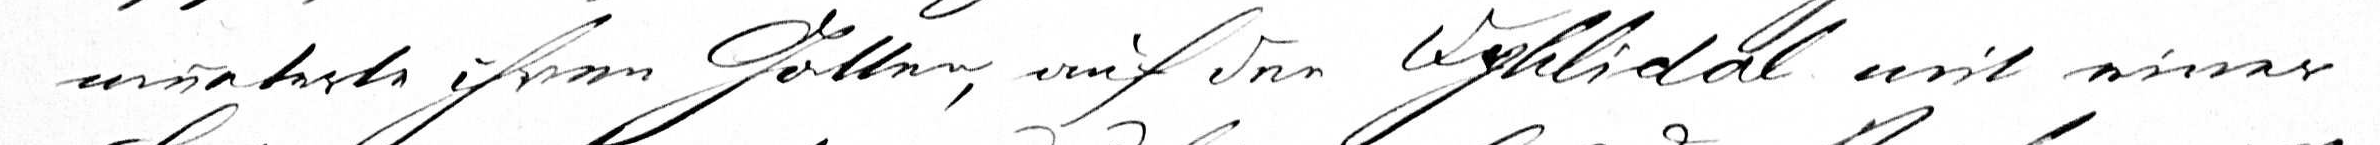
munterte ihren Gatten, auf den Vyhlidal mit einer
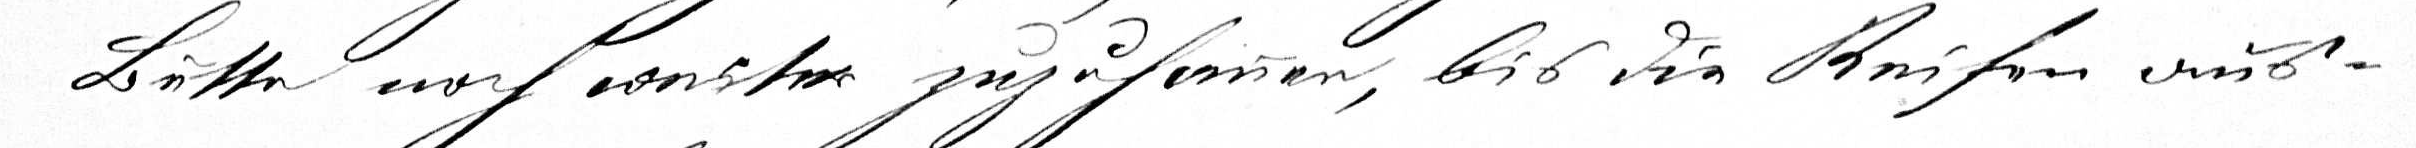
Butte noch weiter zuzuhauen, bis die Reisen aus¬
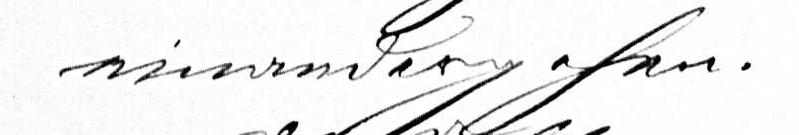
einandergehen.
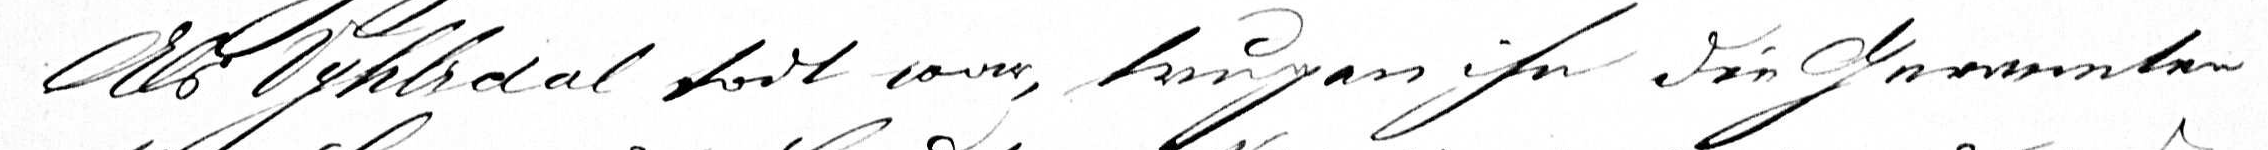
Als Vyhlidal todt war, trugen ihn die Gerannten
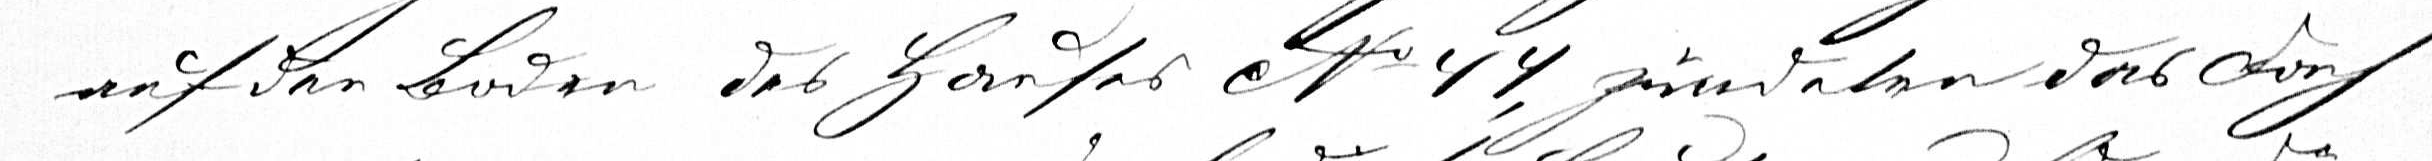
auf den Boden des Hauses No 44, zündeten das Dach
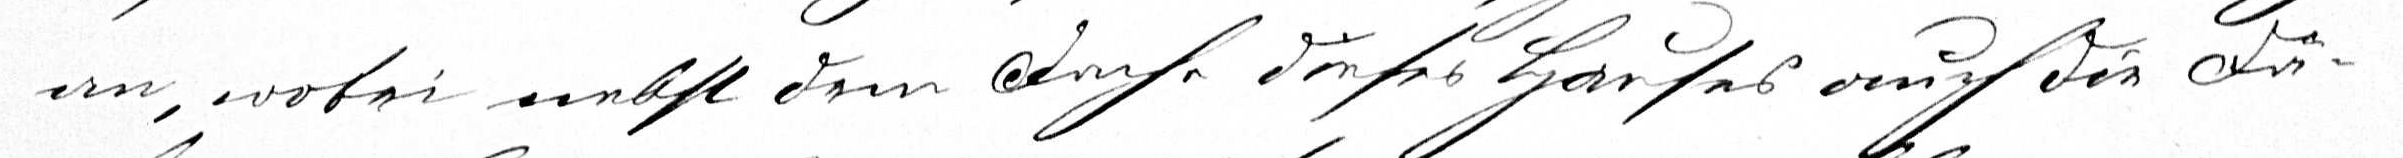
an, wobei nebst dem Dache dieses Hauses auch die Dä¬
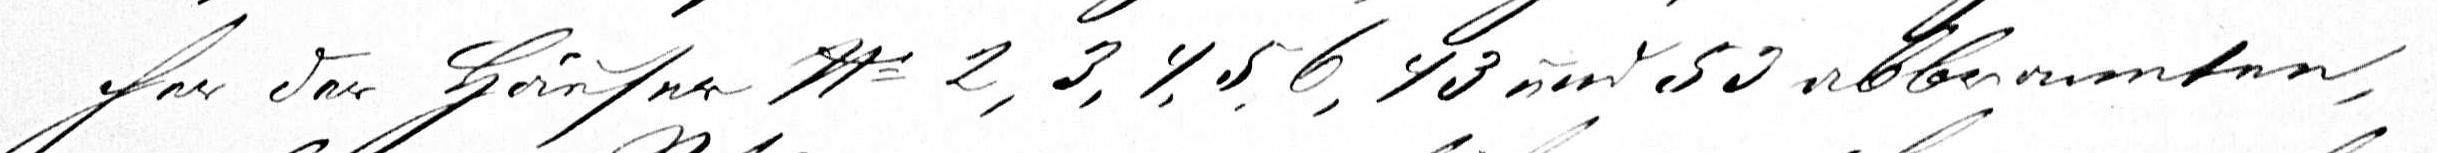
her der Häuser No. 2, 3, 4, 5, 6, 43 und 53 abbrannten,
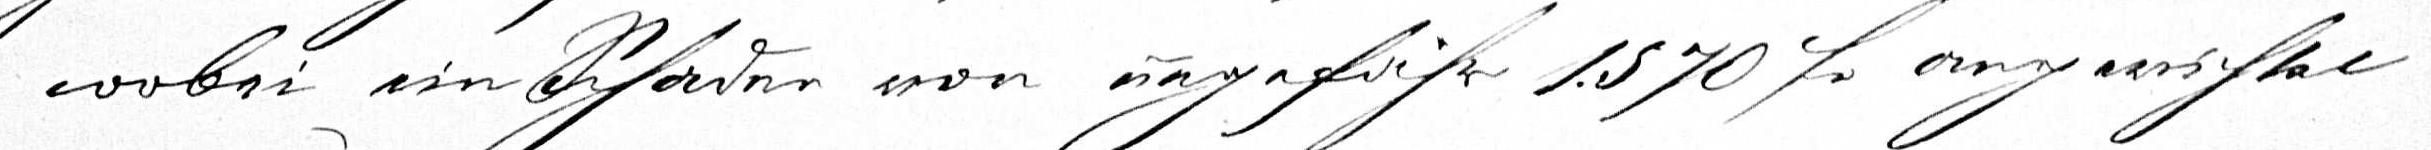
wobei ein Schaden von ungefähr 1570 fr angerichtet
